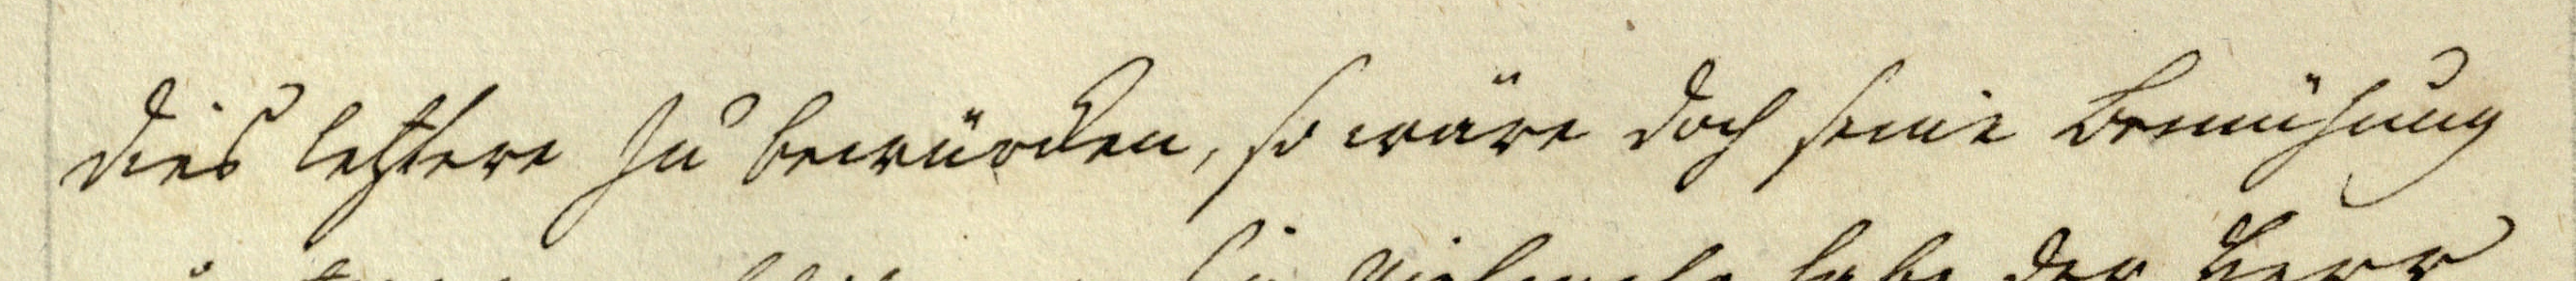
dies letztere zu bewürcken, so wäre doch seine Bemühung
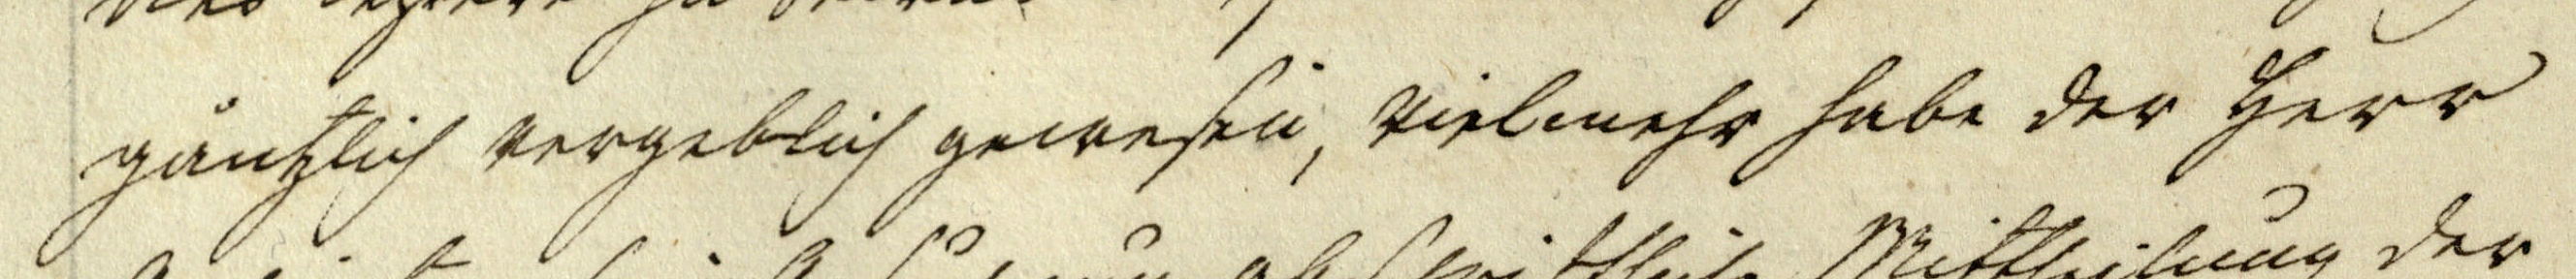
gäntzlich vergeblich gewesen, vielmehr habe der Herr
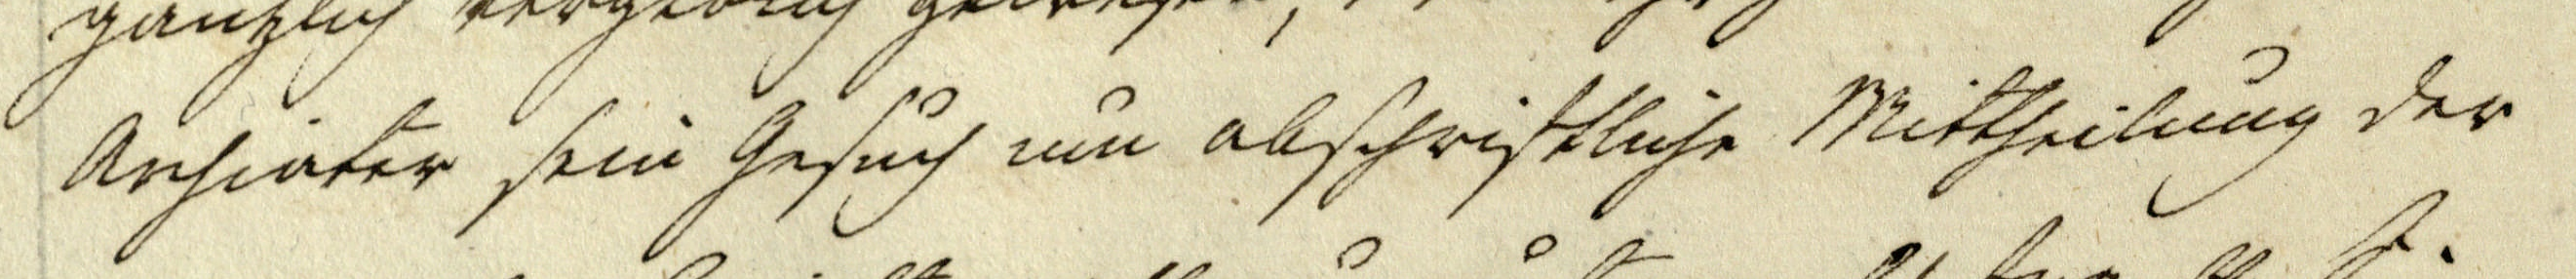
Archiater sein Gesuch um abschriftliche Mittheilung der
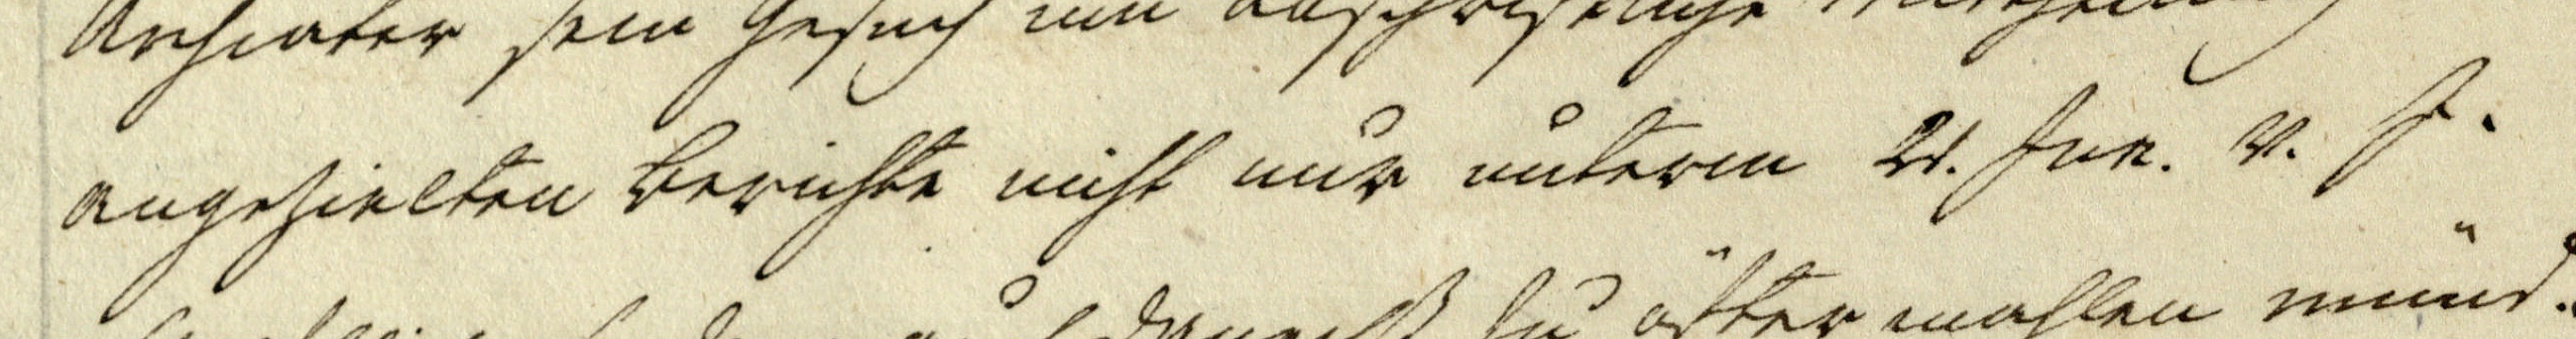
angezielten Berichte nicht nur unterm 21. Jun. v. J.
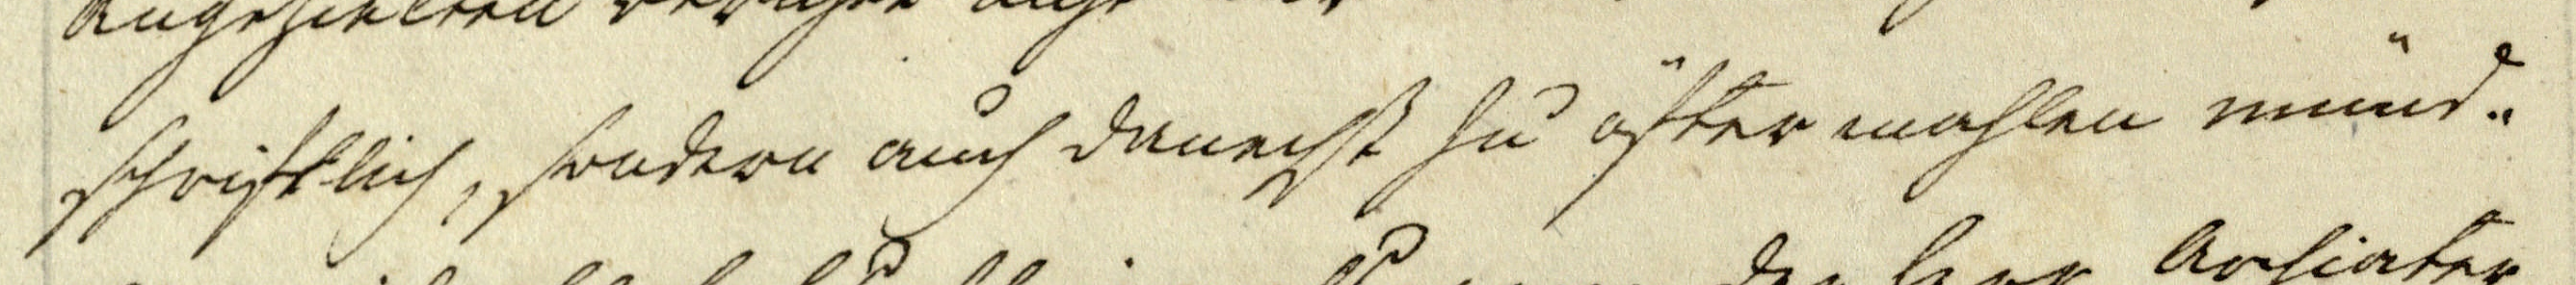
schriftlich, sondern auch danechst zu öfter mahlen münd¬
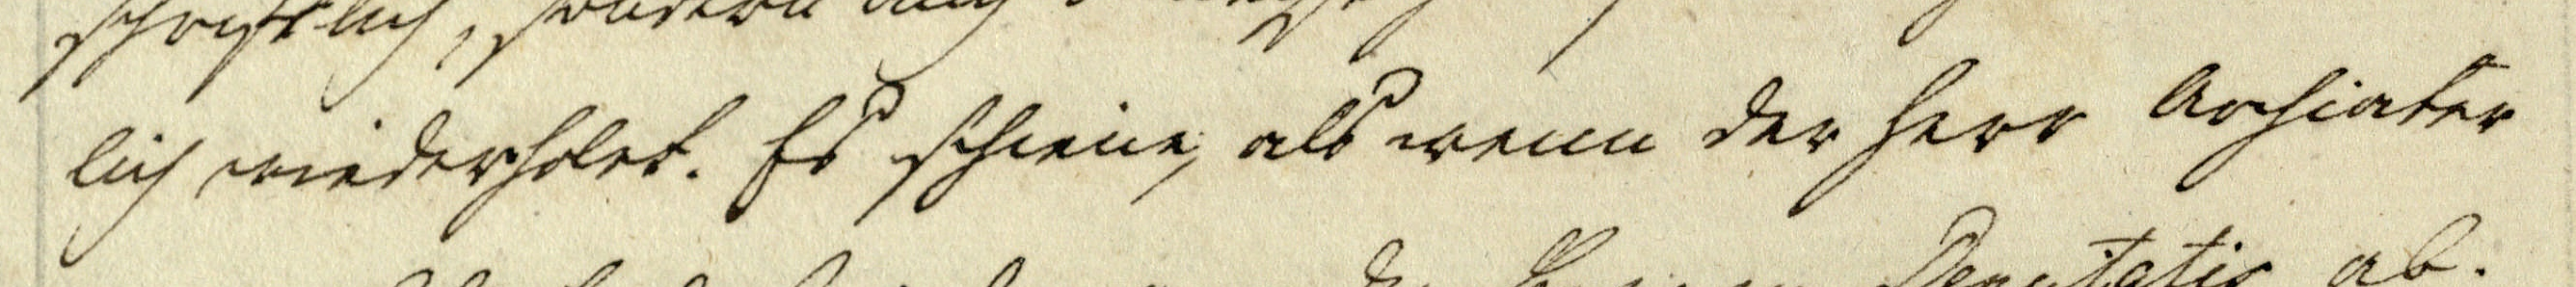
lich wiederholet. Es schiene, als wenn der Herr Archiater
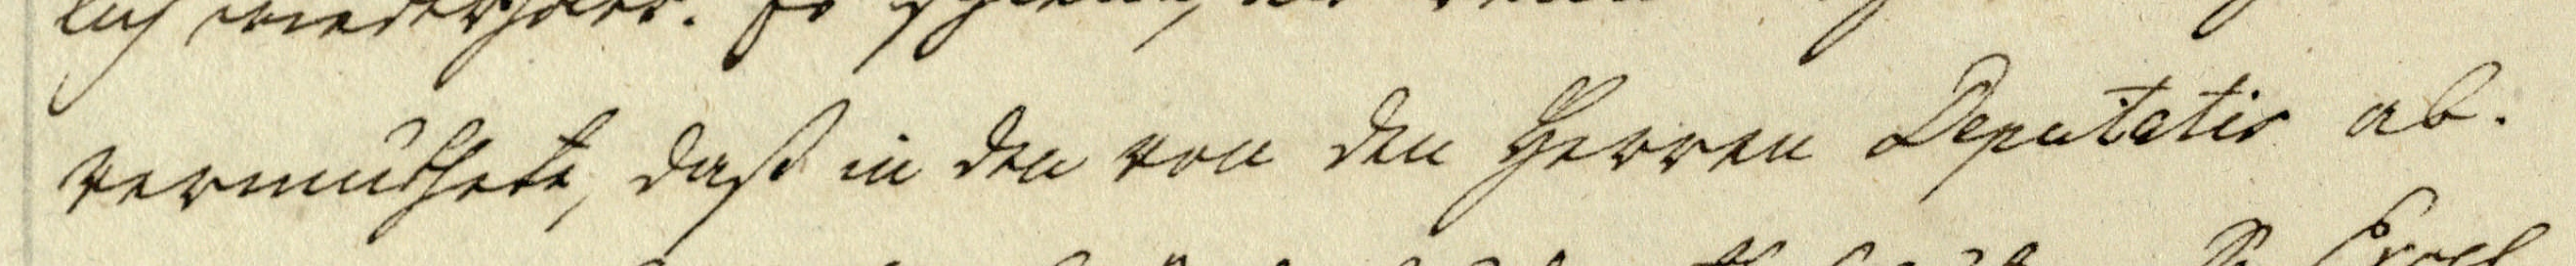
vermuthete, daß in den von den Herren Deputatis ab¬
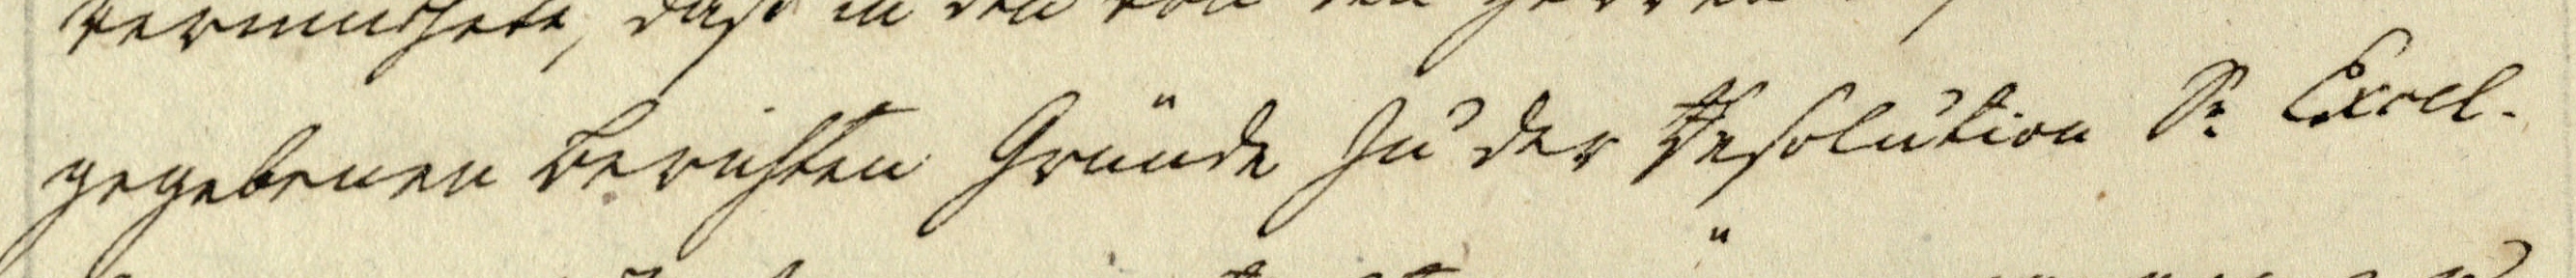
gegebenen Berichten Gründe zu der Resolution Sr. Excel¬
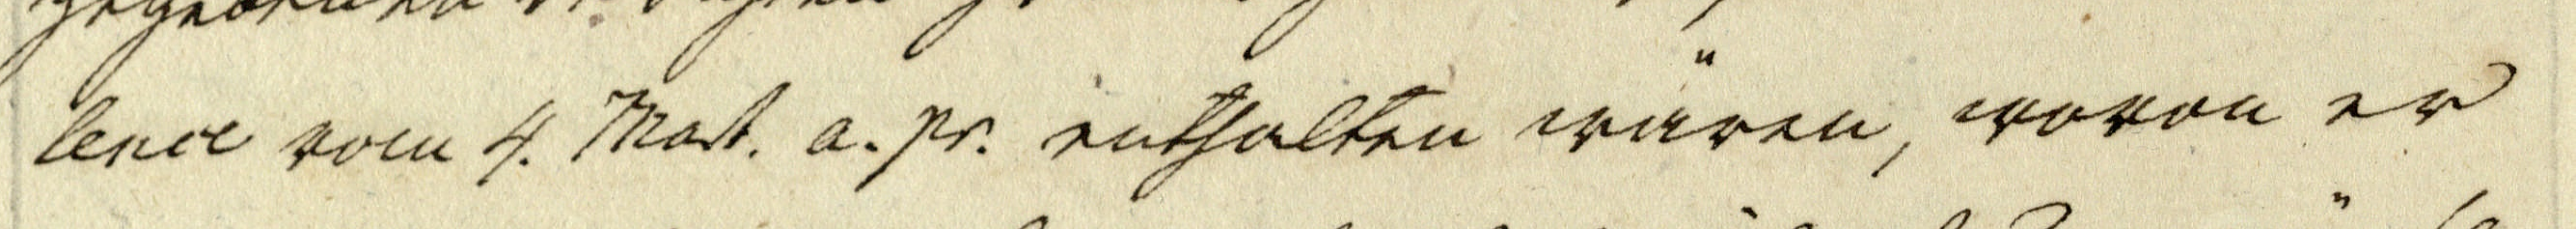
lence vom 4. Mart. a. pr. enthalten wären, wovon er
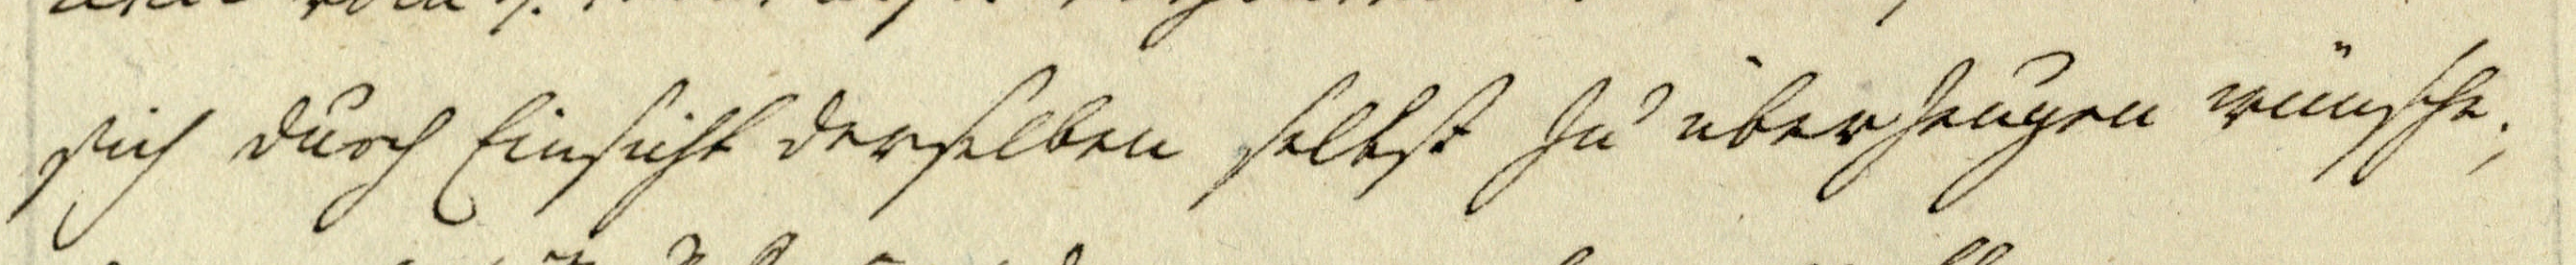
sich durch Einsicht derselben selbst zu überzeugen wünsche;
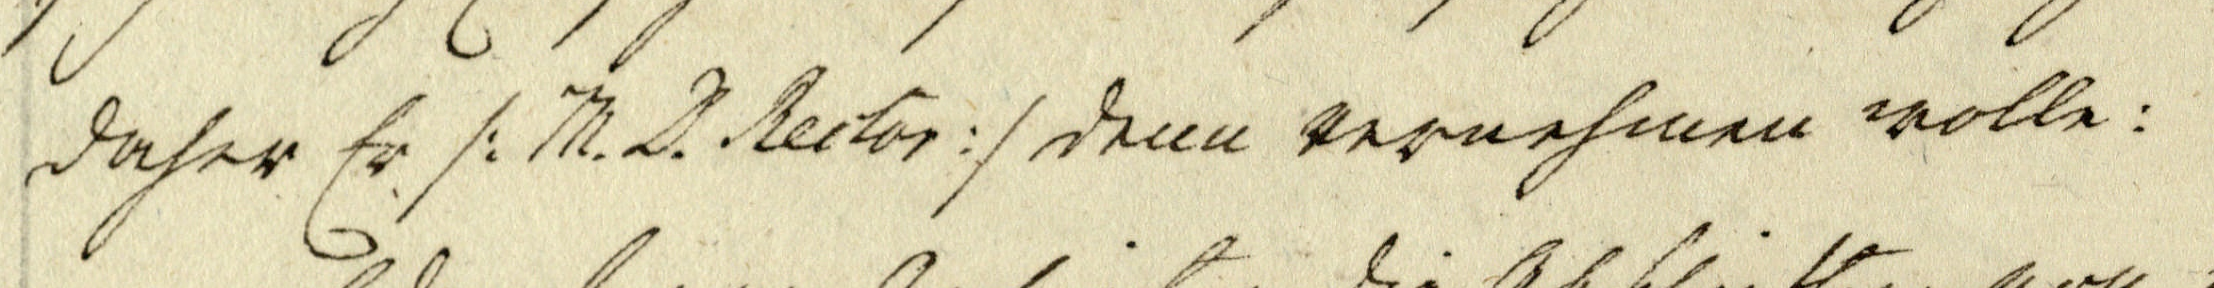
daher Er /: M. D. Rector :/ denn vernehmen wolle:
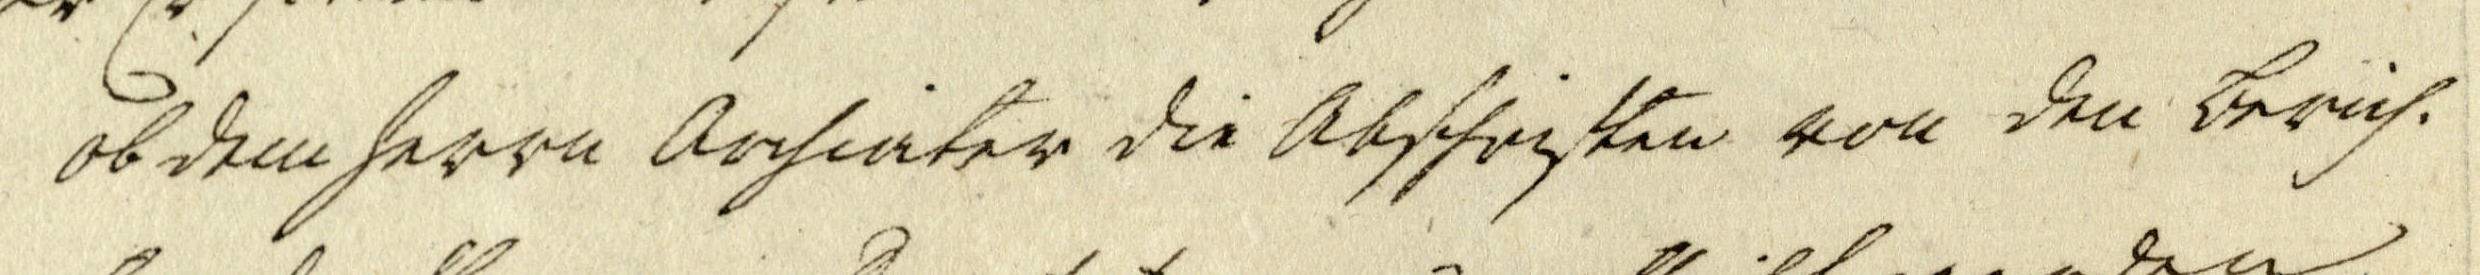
ob dem Herrn Archiater die Abschriften von den Berich¬
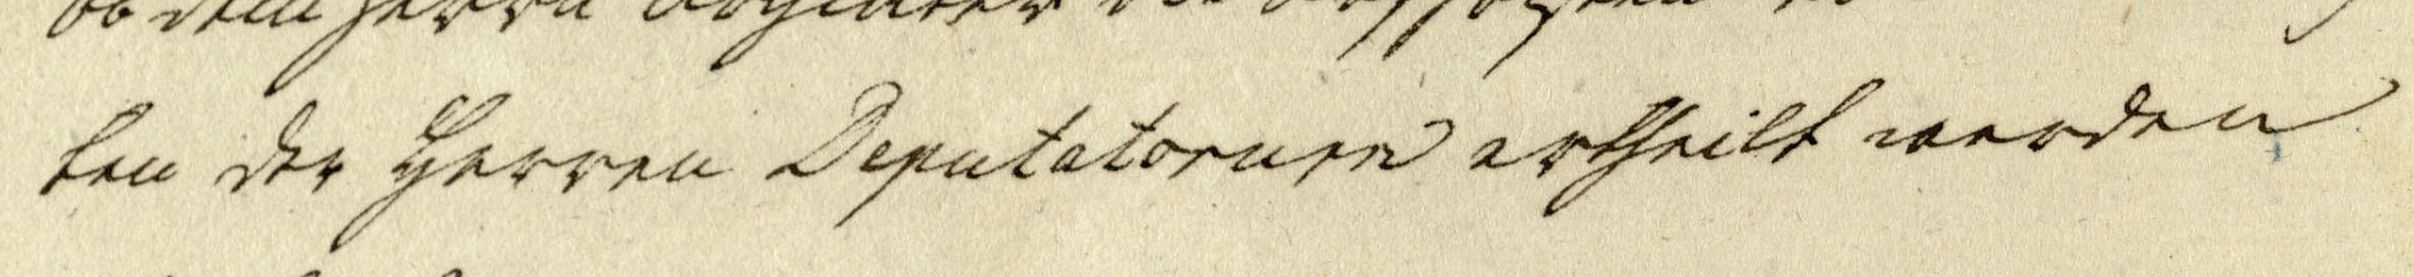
ten der Herren Deputatorum ertheilt werden
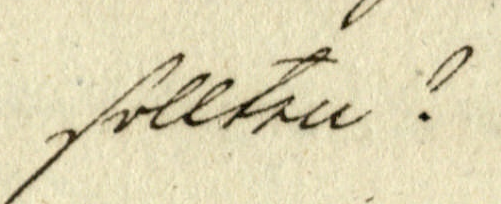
sollten?
